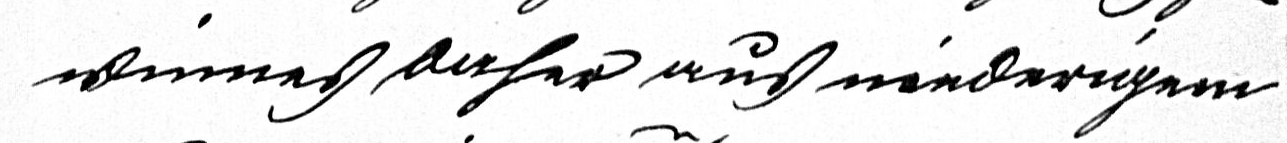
winnes daher aus niederigem
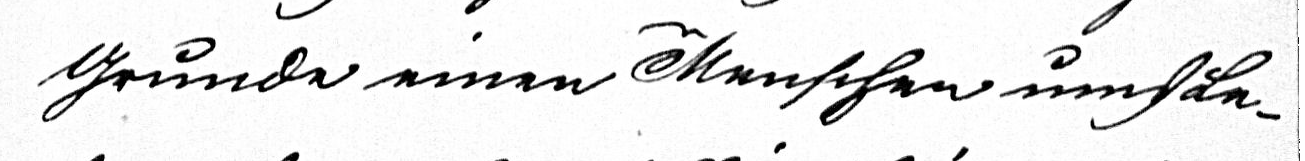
Grunde einen Menschen ums Le¬
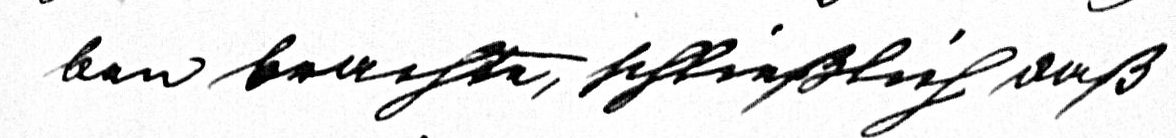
ben brachte, schließlich daß
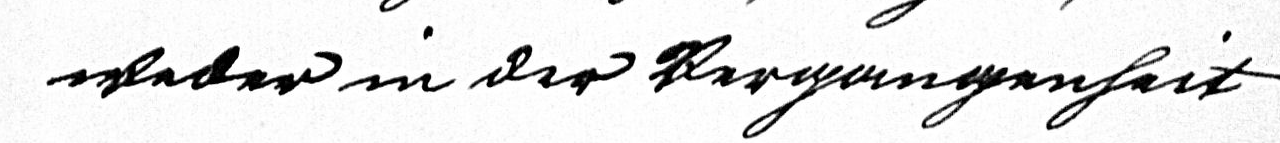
weder in der Vergangenheit
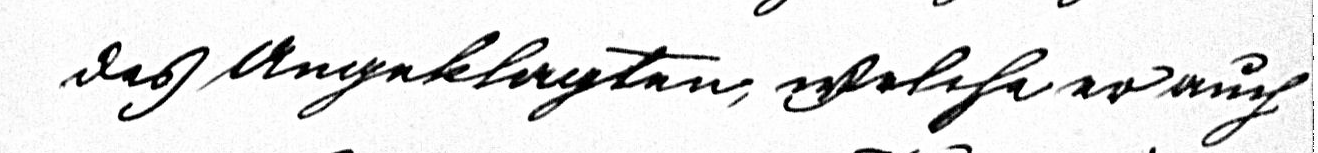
das Angeklagten, welche er auch
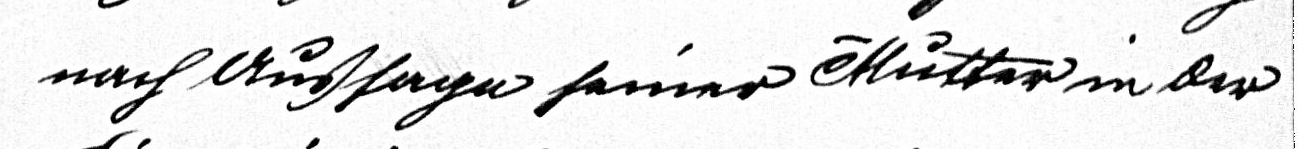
nach Aussage seiner Mutter in der
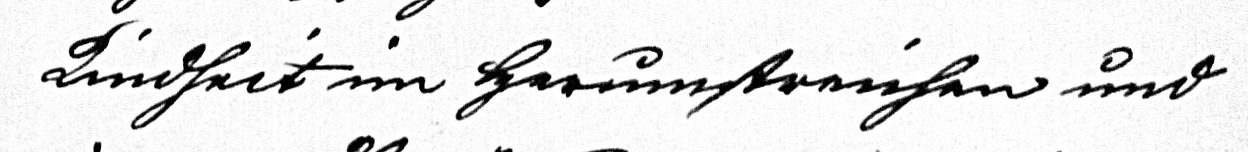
Kindheit im herumstreichen und
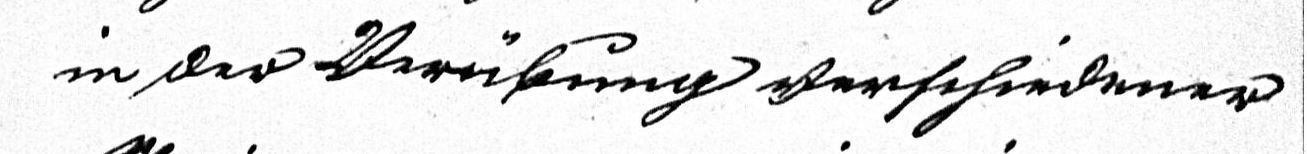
in der Verübung verschiedener
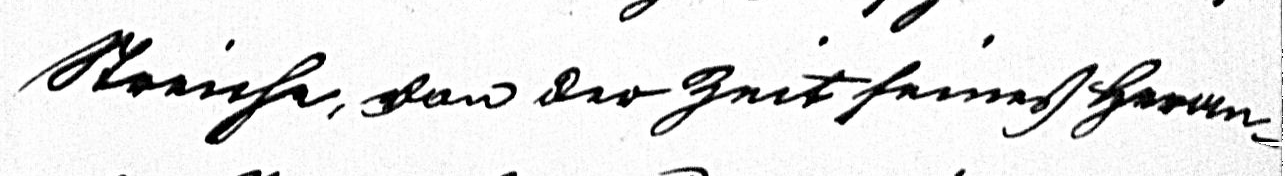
Streiche, von der Zeit seines Heran¬
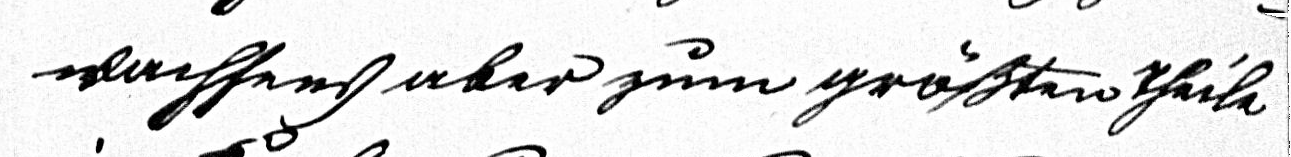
wachsens aber zum größten Theile
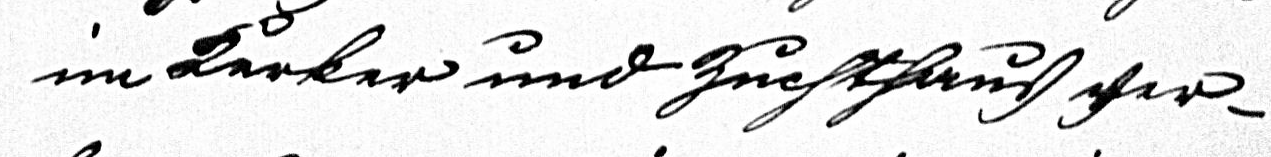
im Kerker und Zuchthaus ver¬
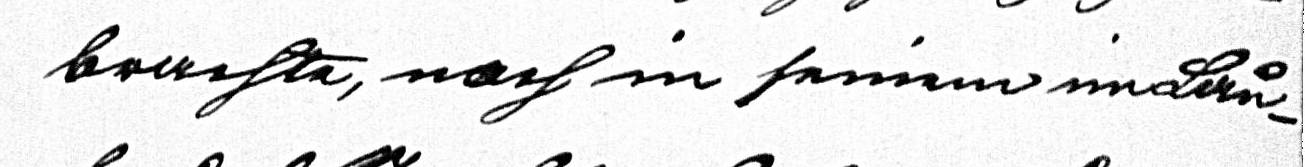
brachte, nach in seinem im Lau¬
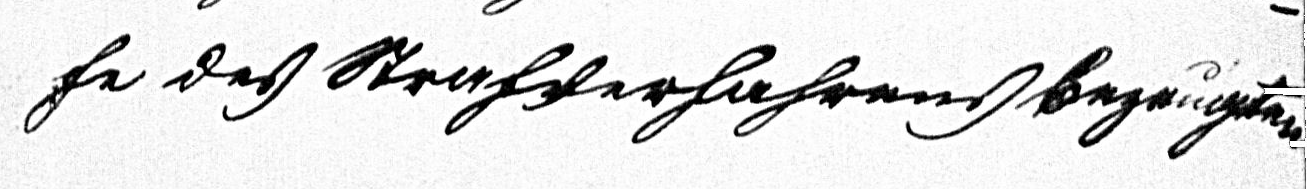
fe des Strafverfahrens bezeugten
